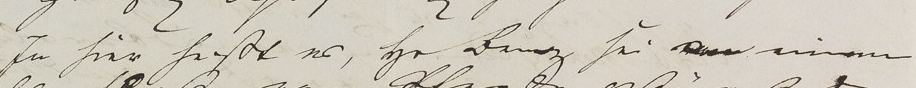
In hier heißt es, Hr Benz sei an einem
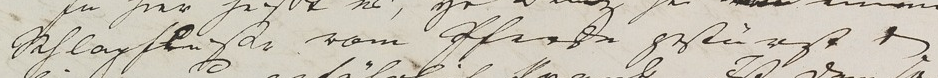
Schlagfluße vom Pferde gestürzt &
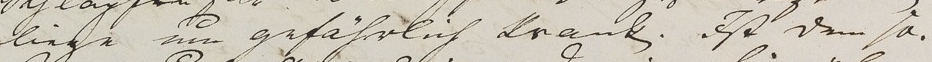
liege nun gefährlich krank. Ist dem so?
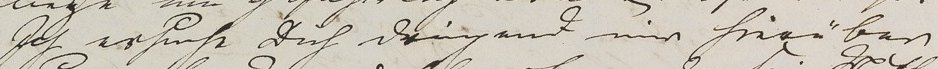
Ich ersuche Dich dringend mir hierüber
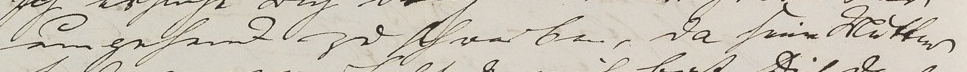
umgehend zu schreiben, da seine Mutter
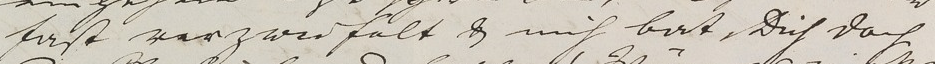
fast verzweifelt & mich bat, Dich doch
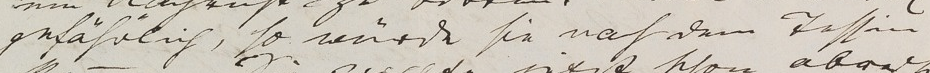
gefährlich, so würde sie nach dem Tessin
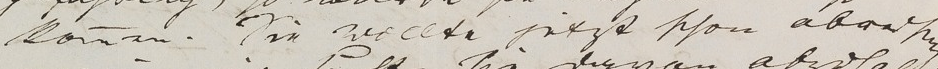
kommen. Sie wollte jetzt schon abreisen,
